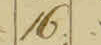16.
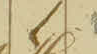1.
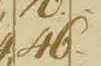46.
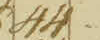44.
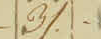31.
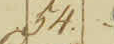54.
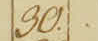30.
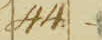44.
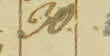30.
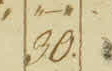30.
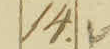14.
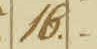16.
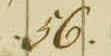56.
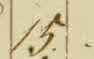15.
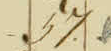57.
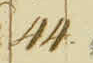44
